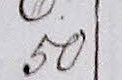50
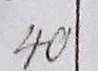40
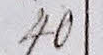40
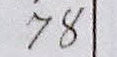78
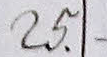25.
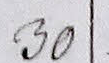30
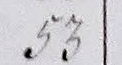53
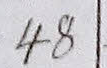48
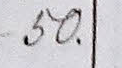50.
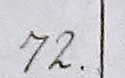72.
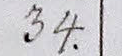34.
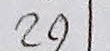29
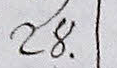28.
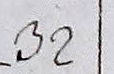32
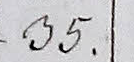35.
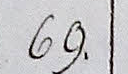69.
